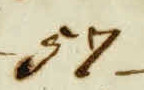57
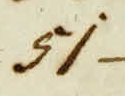51
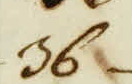36
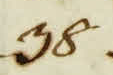38
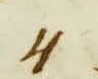4
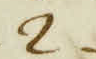2
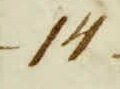14
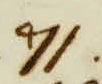71
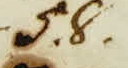58
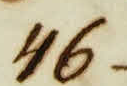46
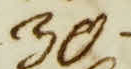30
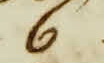6
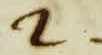2
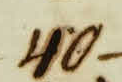40
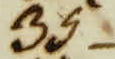35
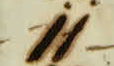11
